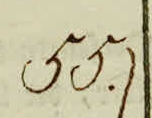55.
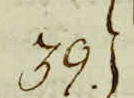39.
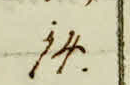14.
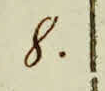8.
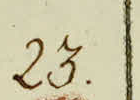23.
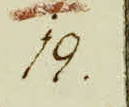19.
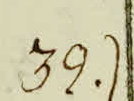39.
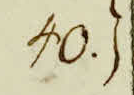40.
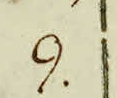9.
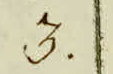3.
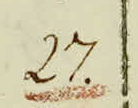27.
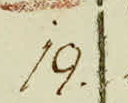19.
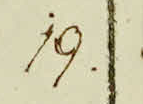19.
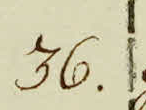36.
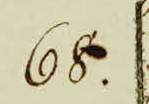68.
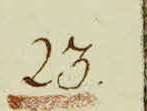23.
